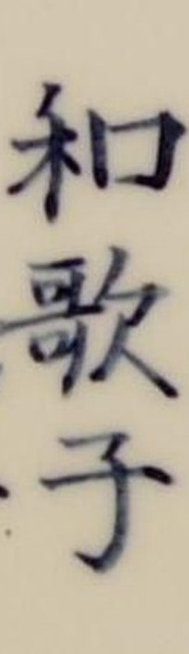和歌子
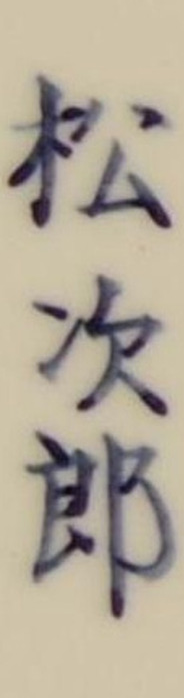松次郎
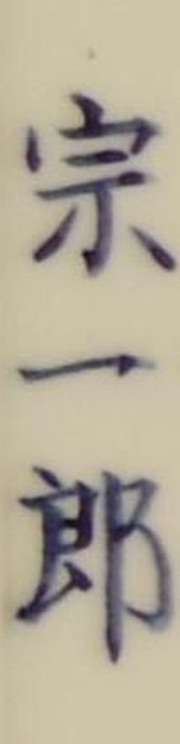宗一郎

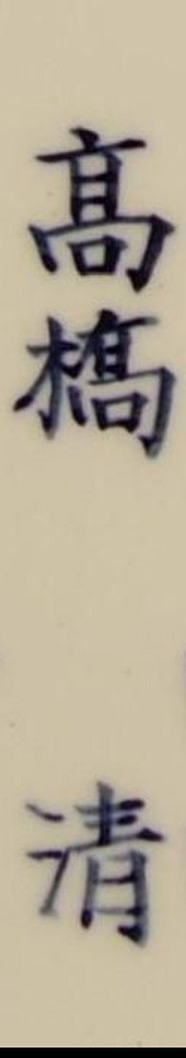高橋清
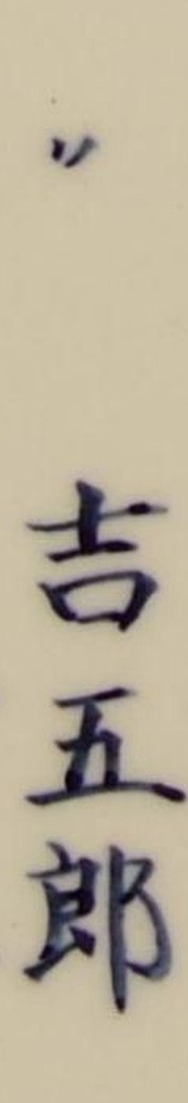吉五郎
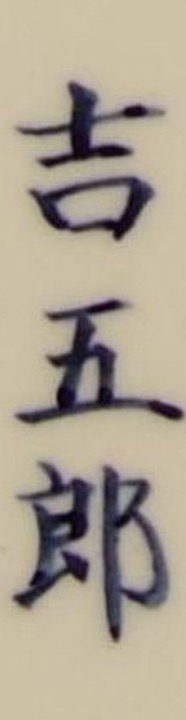吉五郎
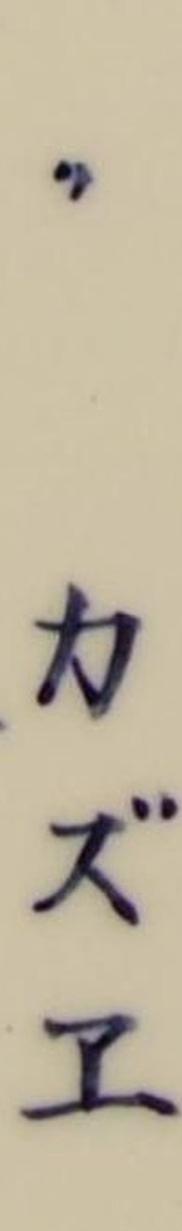カズヱ
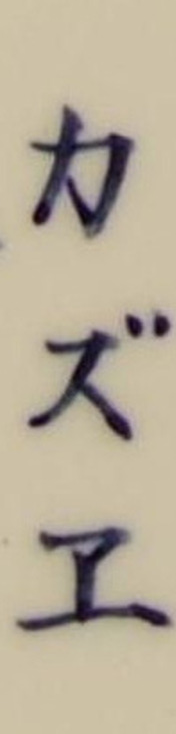カズヱ
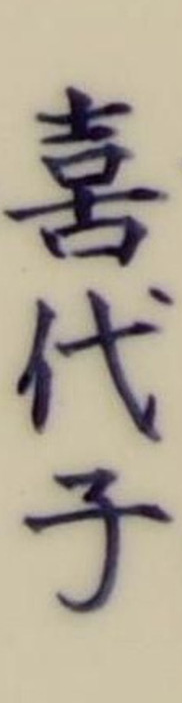喜代子
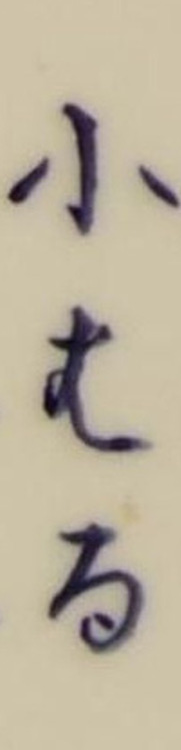小はる

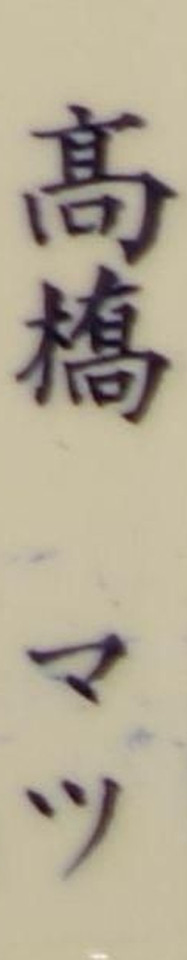高橋マツ
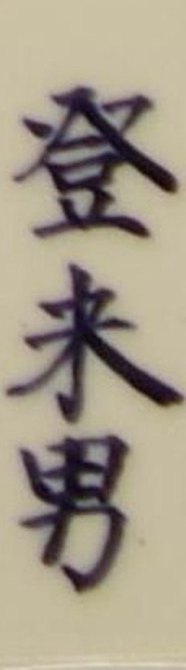登米男
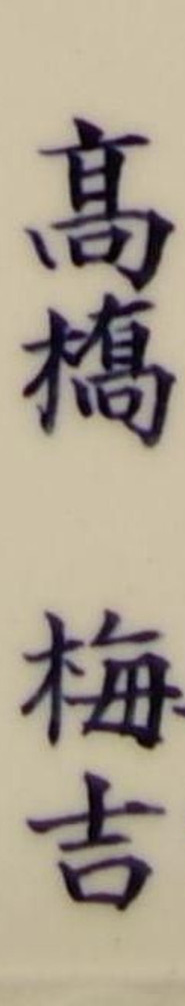高橋梅吉
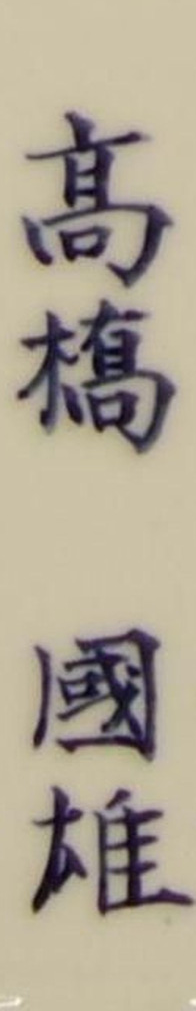高橋國雄

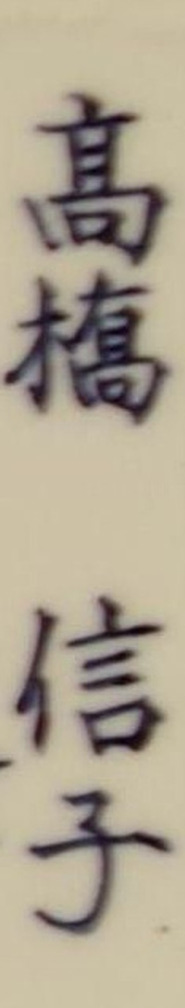高橋信子
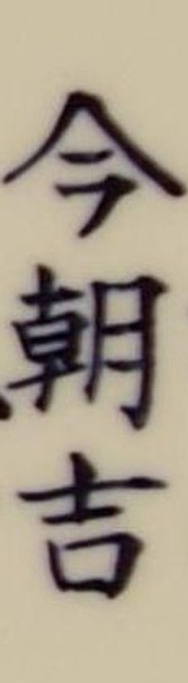今朝吉
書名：E~L
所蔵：高野山金剛峯寺
